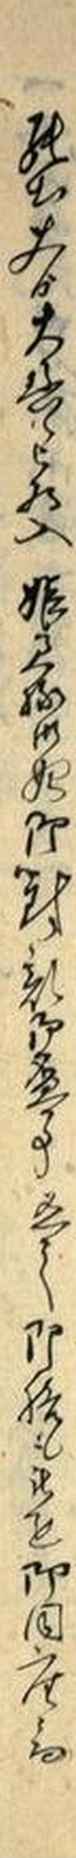罷出夫ゟ大奥へ被為入姫君様御始御対顔御盃事有之御膳も被進御同座ニ而
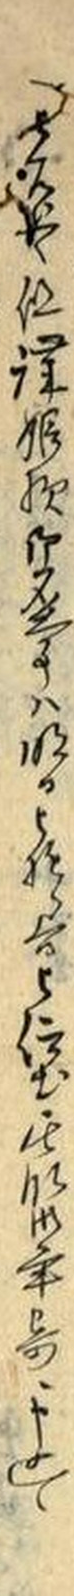被召上候但謹姫様御盃事ハ明日被遊候旨被仰出其段御年寄へ申込候

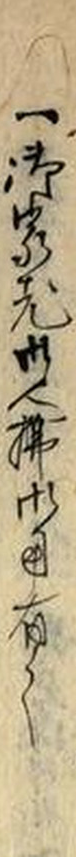一御家老御人払御用有之
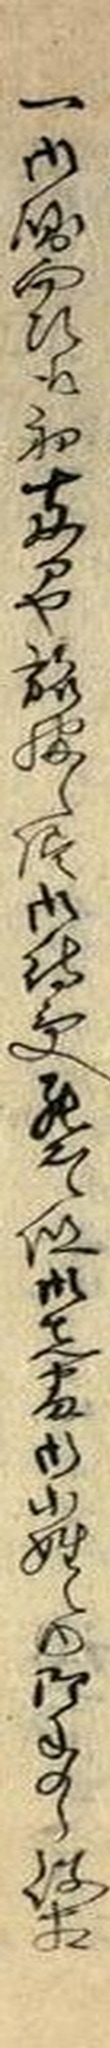一御側向頭取初両部ヤ旅服之侭御待受罷出候但御先番御小姓之内御手のし役相
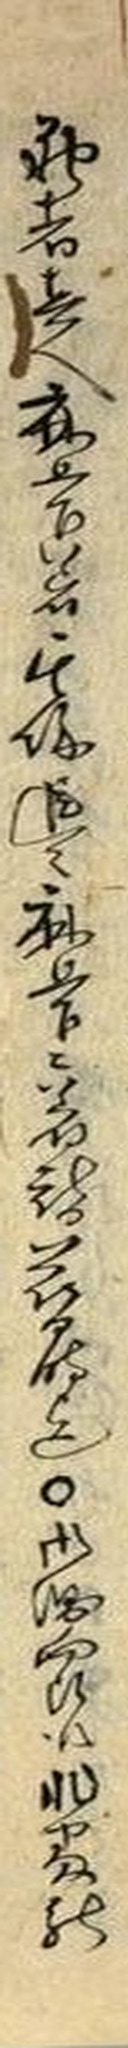勤候者壱人麻上下着其余追々麻上下ニ着替暮時迄○御側向頭取非番新
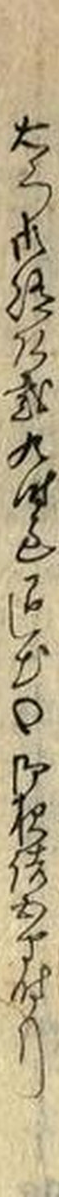右衛門御賄頂戴九時過退出○御夜詰五半時引
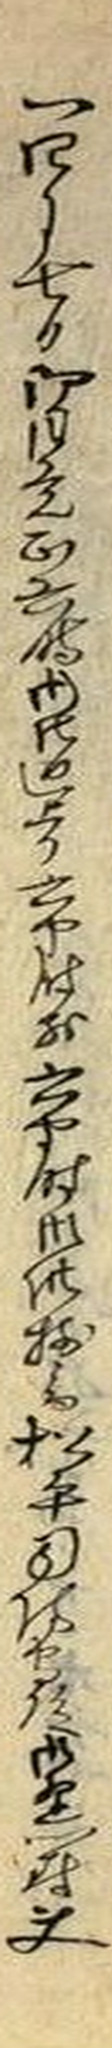一四月七日御目覚正六時御仕廻上り六半時前六半時前御供揃ニ而松平周防守様御逢対夫
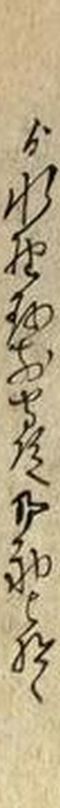ゟ水野越前守殿御勤被遊候
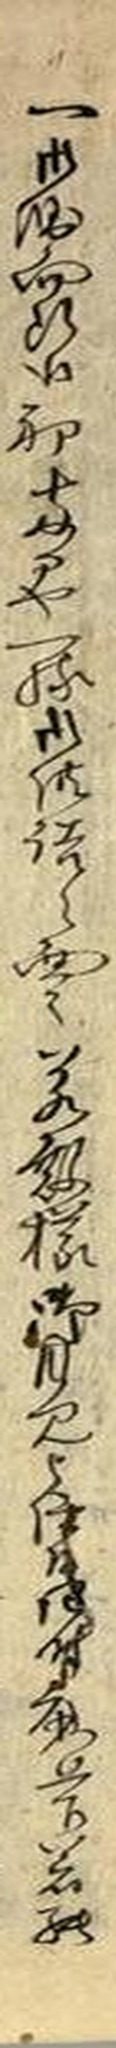一御側向頭取初両部ヤ一統御供詰之面々若殿様御目見被仰付四時麻上下着罷
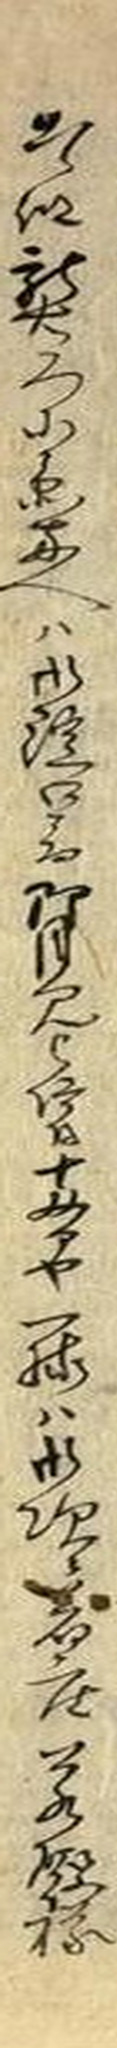出候但新右衛門小兵衛両人ハ御錠口ニ而御目見被仰付両部ヤ一統ハ御次ニ着座若殿様
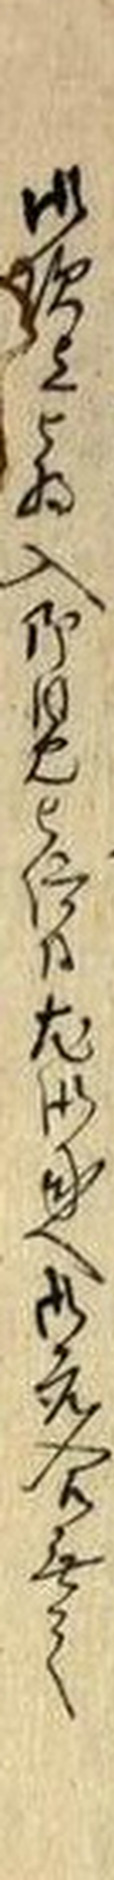御次迄被為入御目見被仰付尤御用人御取合無之
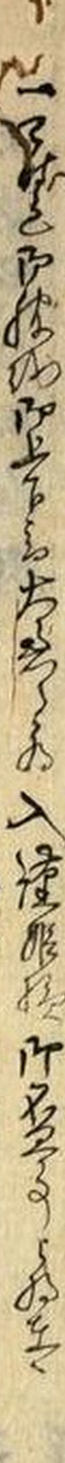一四時過御服紗御上下ニ而大奥被為入謹姫様御盃事被為在候
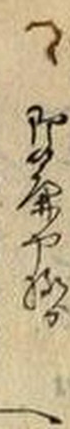御簾中様ゟ
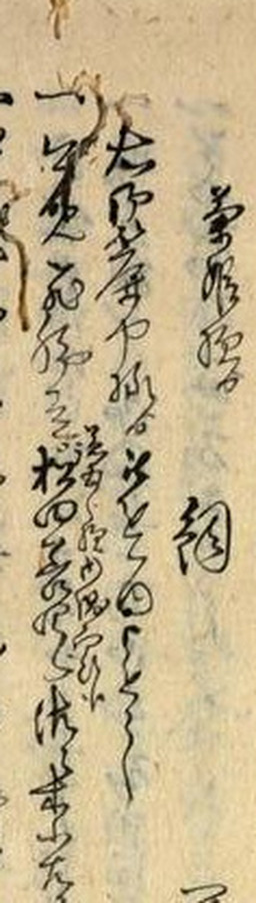右御簾中様ゟ被進候物被下之
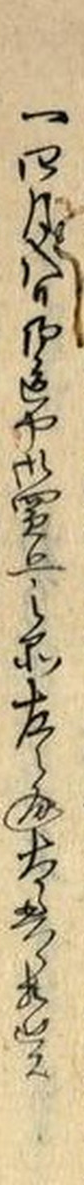一四月八日御道中御買上之品左之通大奥へ相廻ス
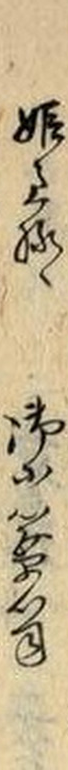姫君様へ御小箪笥一
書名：少傅日録抄（斉承付側向頭取日記、在府）
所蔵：福井県文書館 Fukui Prefectural Archives
